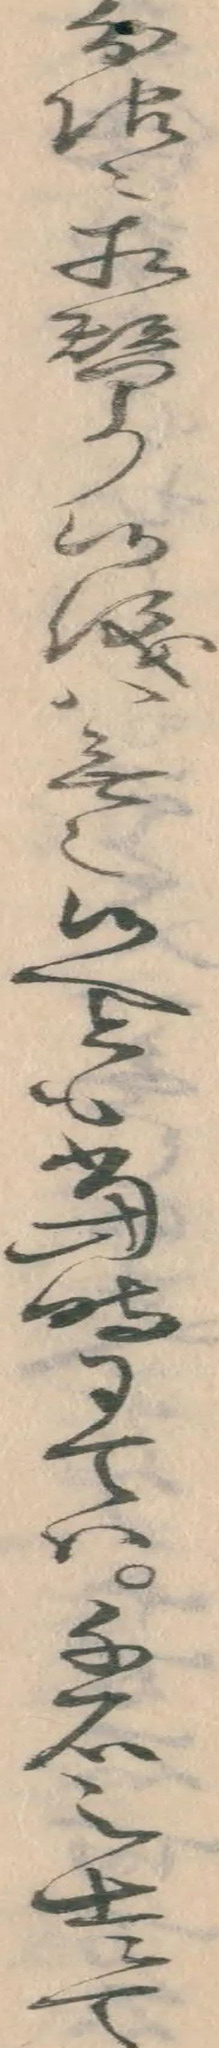分限に相替り候儀は無之候へとも当時にては。千石之士にて
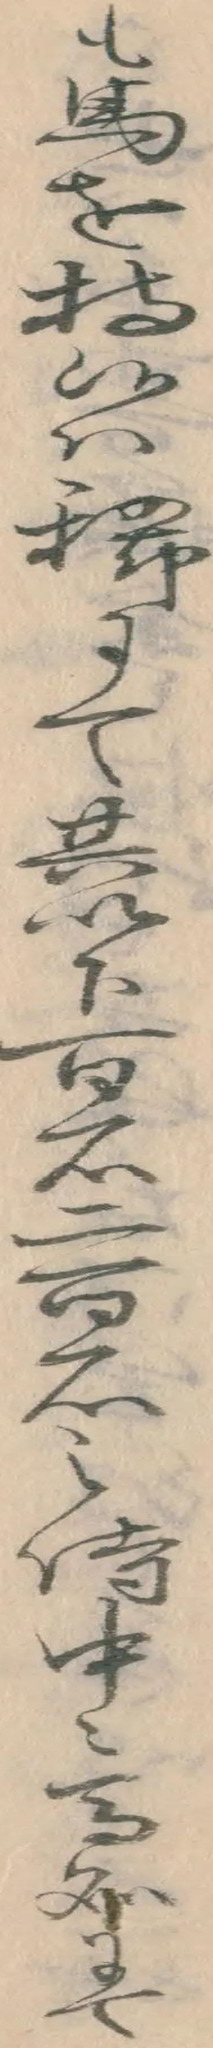も馬を持候は稀にて其以下百石二百石之侍中々馬処にて
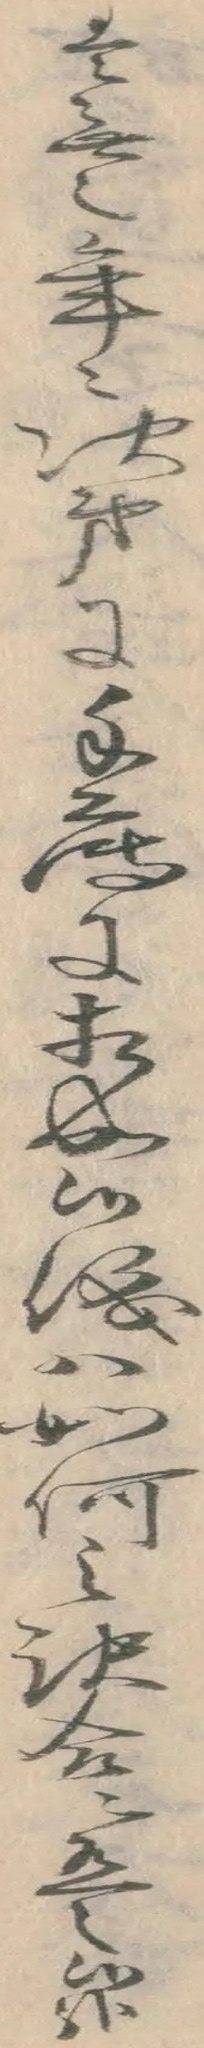は無之年々次第に手薄に相成候儀は如何之訳合に有之候哉
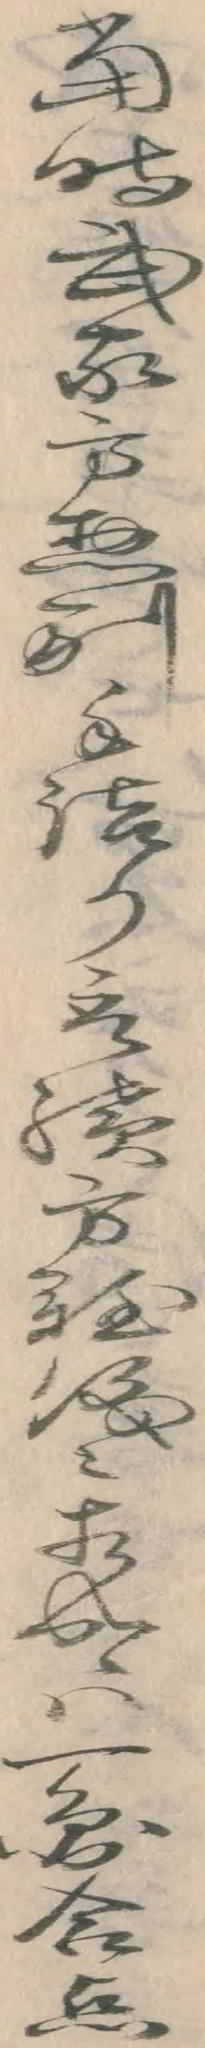当時武家方惣別手詰り取続方難儀に相成候は一円合点
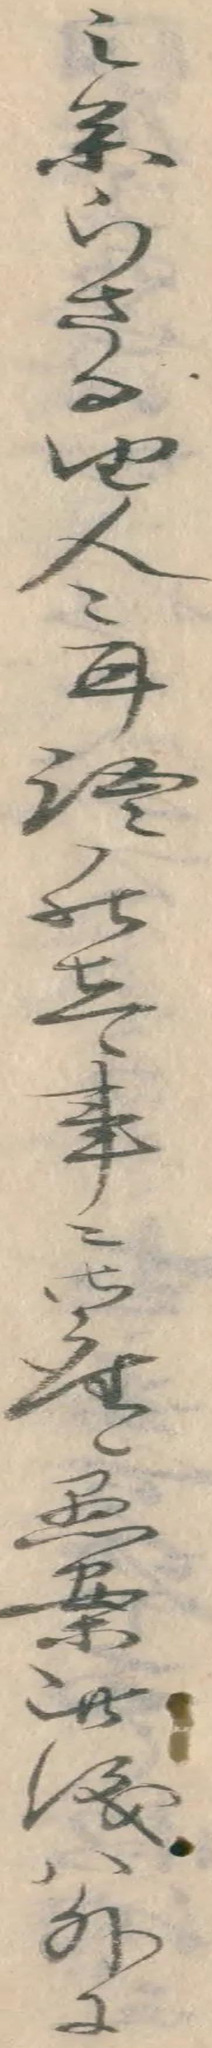之参らさる由人々耳語罷在候事に御座候愚案此儀は外に
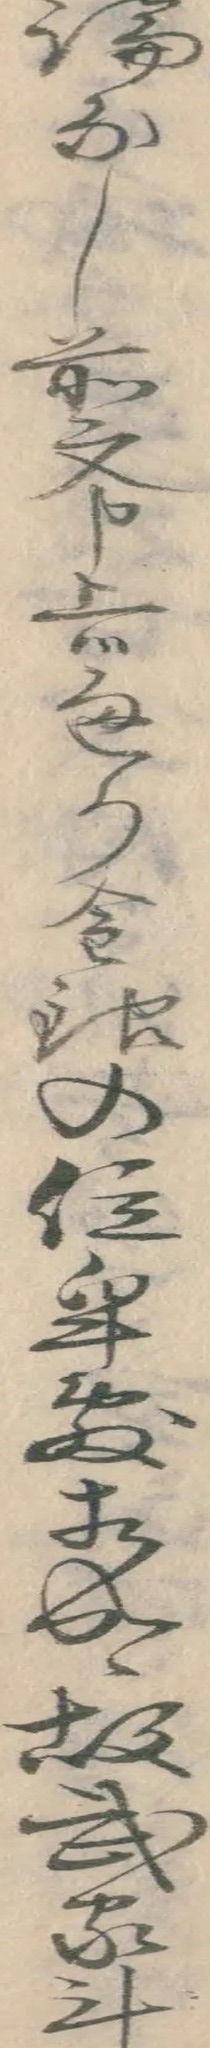論なし前文申上候通り金銀の位卑敷相成候故武家計
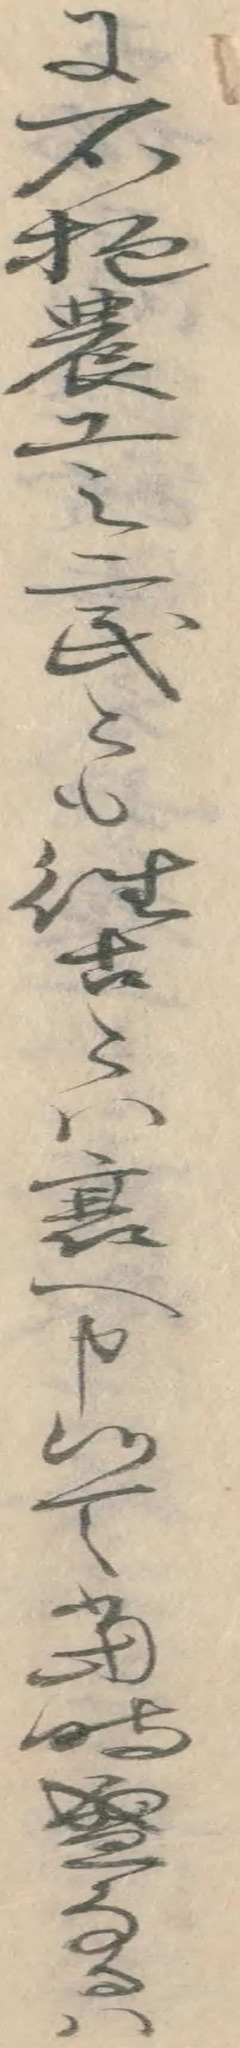に不抱農工之二民とも往古とは衰へ申候て当時盛なるは
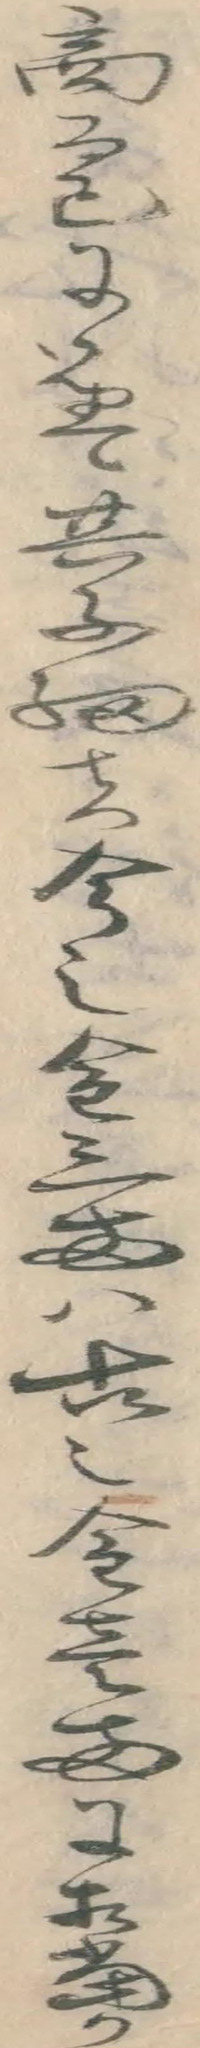商而已に御坐候其子細者今之金三両は古之金壱両に相当り

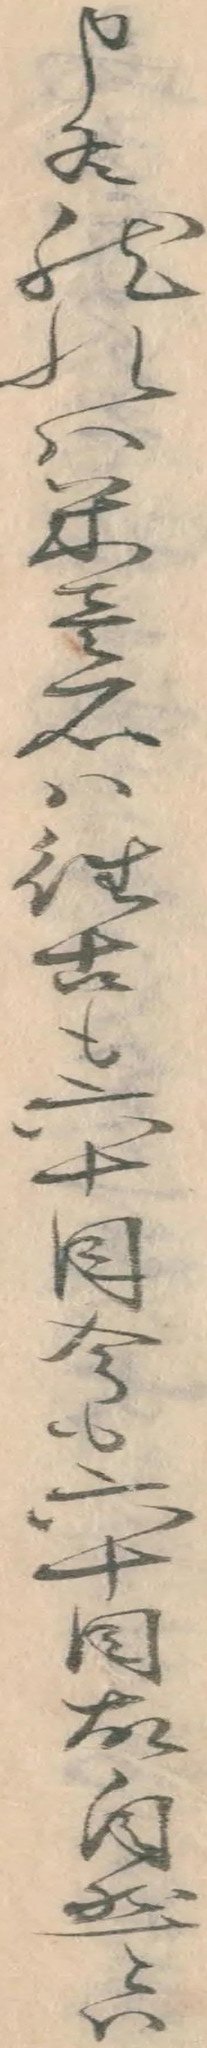申候然れは米壱石は往古も六十目今も六十目故自然とは
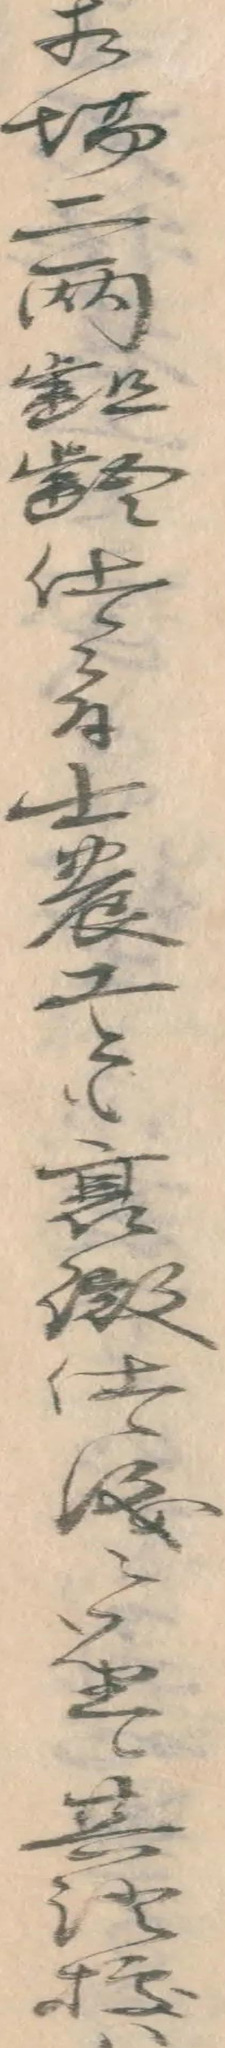相場二両齟齬仕候に付士農工とも衰徴仕候儀に御坐候其証拠は
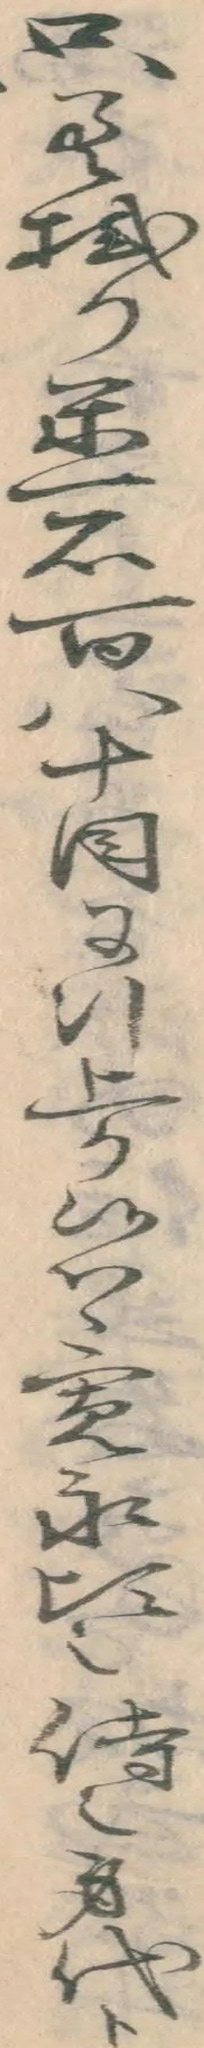只差掛り米一石百八十目に引上り候はゝ寛永頃之侍之身代と
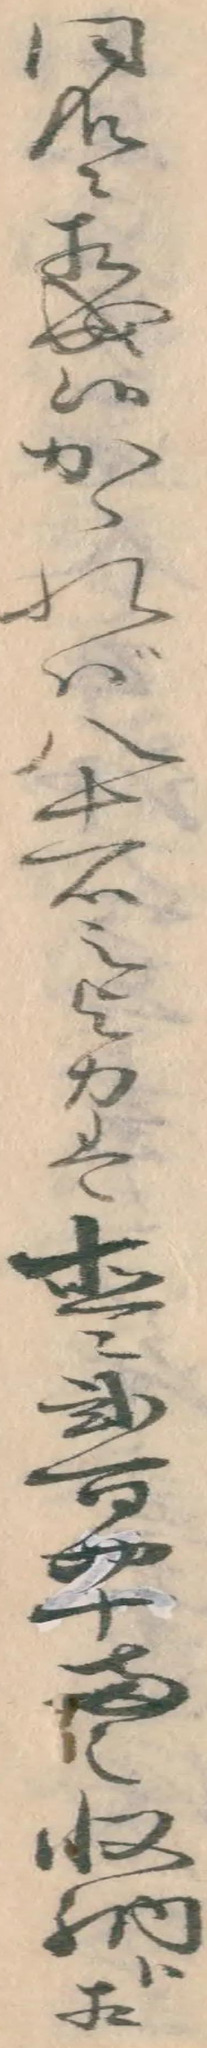同様に相成候かゝれば八十石之与力は直に弐百四十両之収納と相
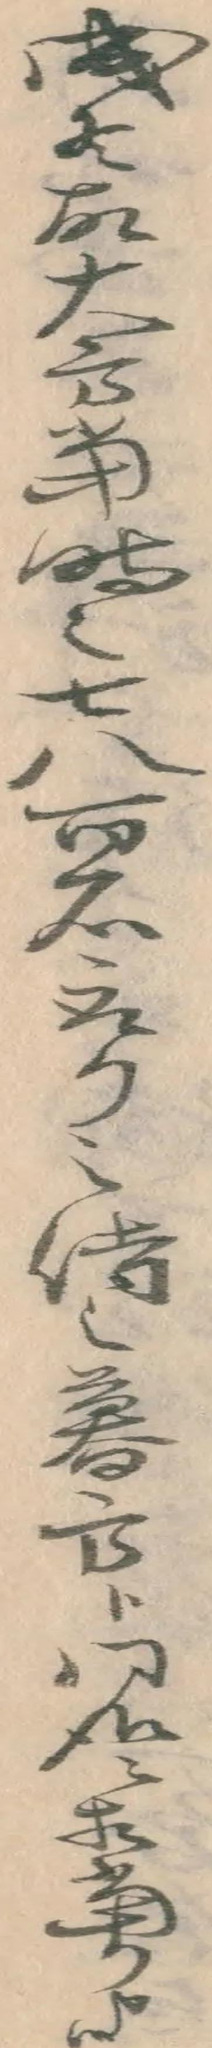成候故大方当時之七八百石取り之侍之暮方と同様に相当り申候
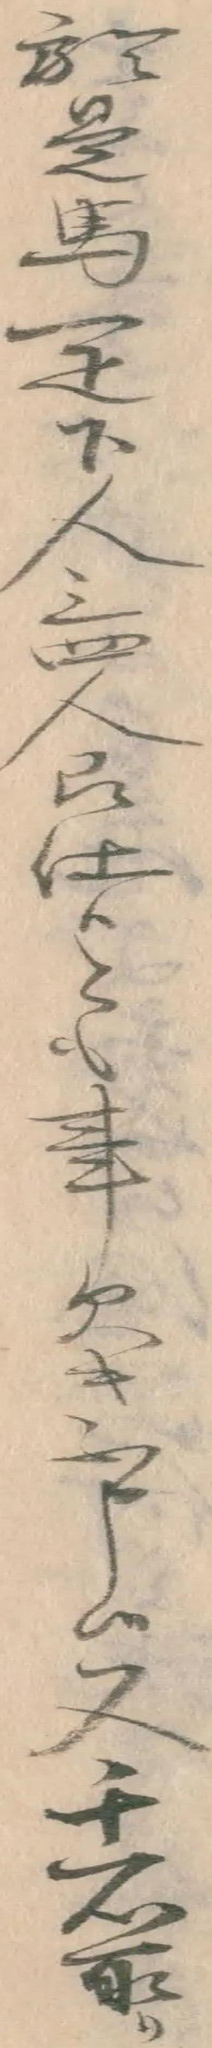於是馬一疋下人三四人召仕候とも事欠き不申候又千石取り
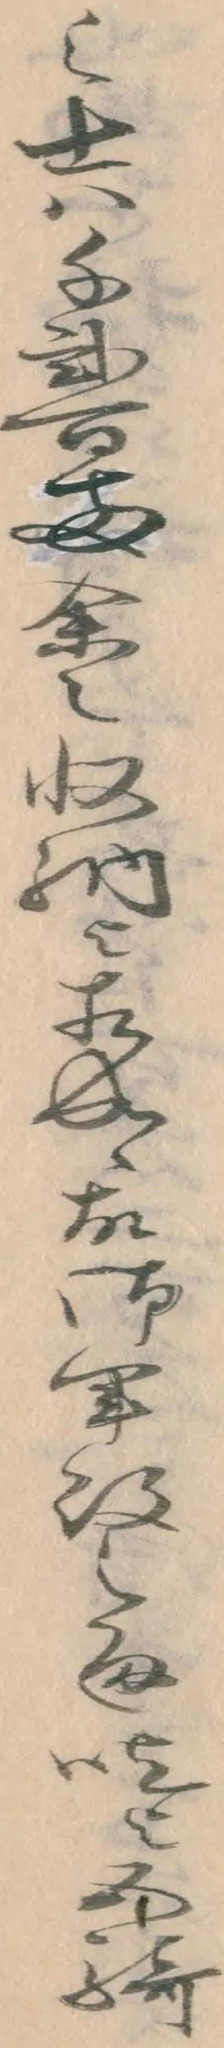之士は千弐百両余之収納と相成候故御軍役之通吃と五騎
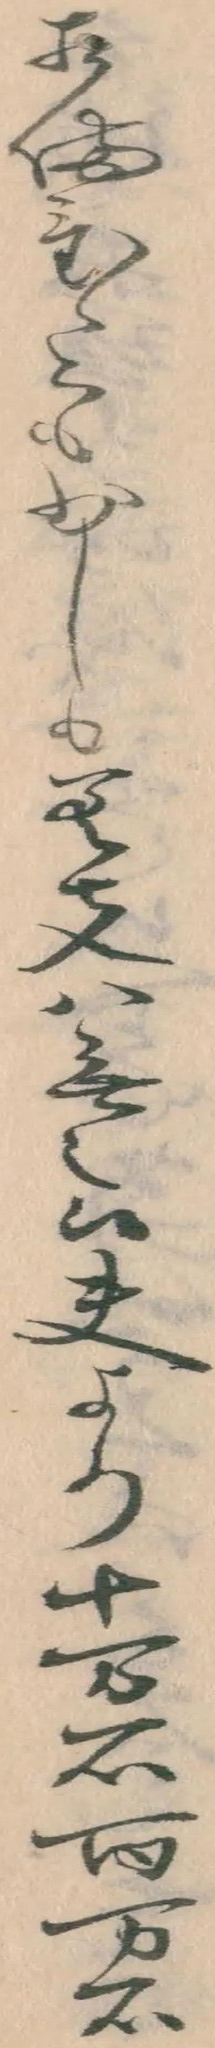相備置候とも少しも差支は無之候夫より十万石百万石
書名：斎庭之穂
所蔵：国立国会図書館 National Diet Library, JAPAN
